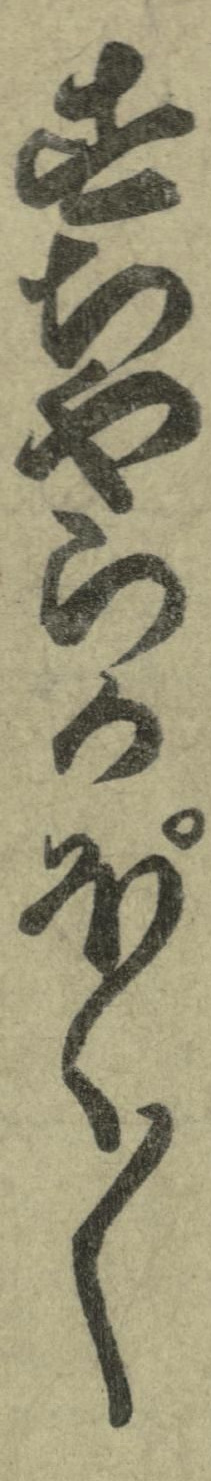すちやらかぽく〳〵
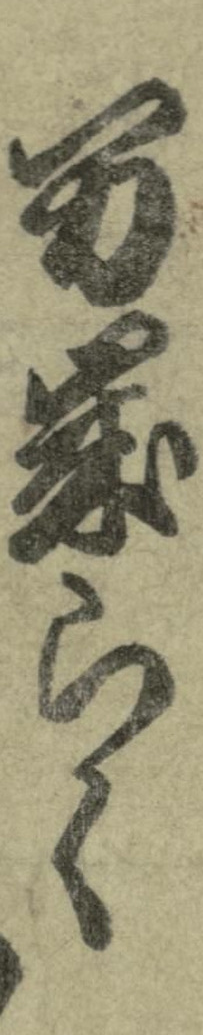万歳らく
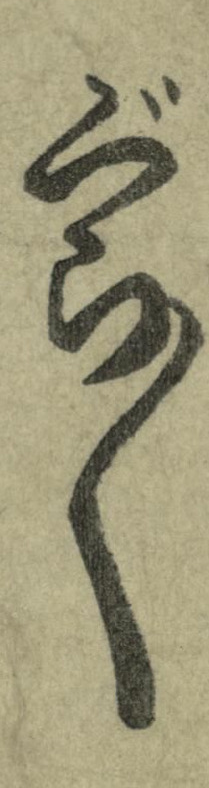ぐら〳〵
